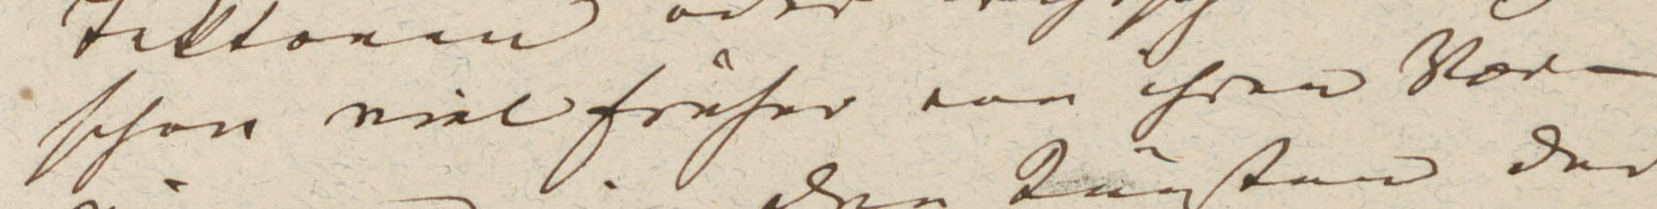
schon viel früher von ihren Vor-
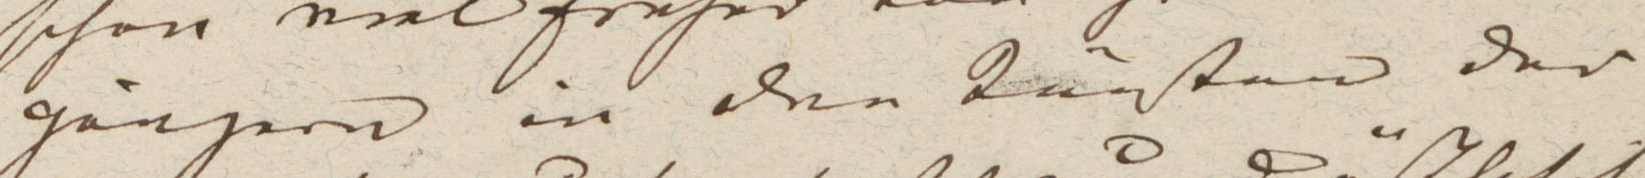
gängern in den Künsten der
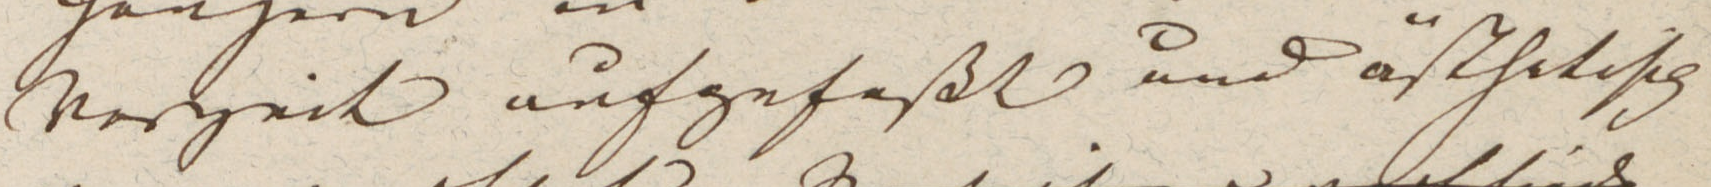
Vorzeit aufgefasst und ästhetisch
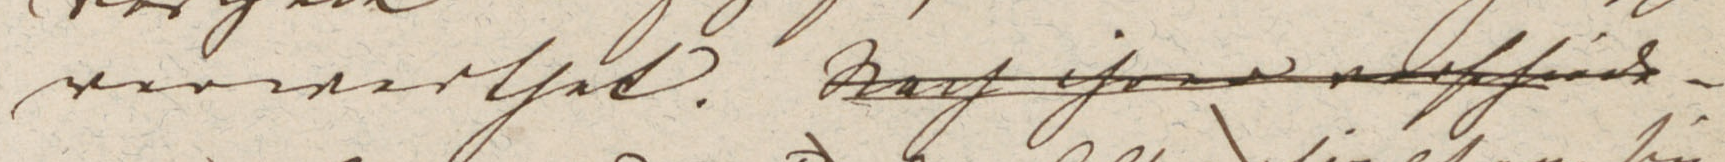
verwerthet. Nach ihrer verschiede-
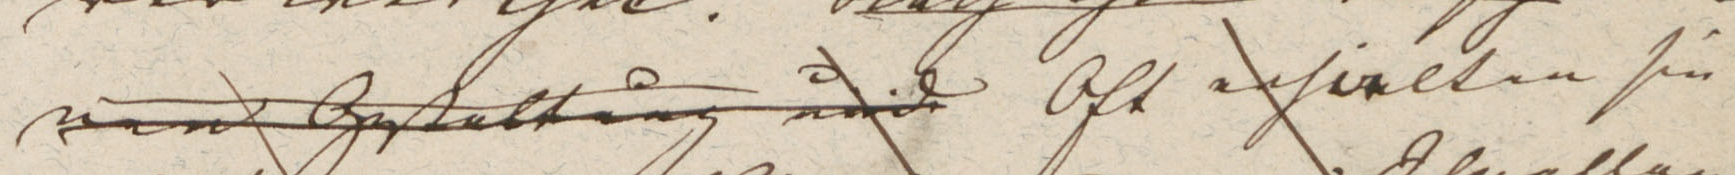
nen Gestaltung und Oft erhiealten sie
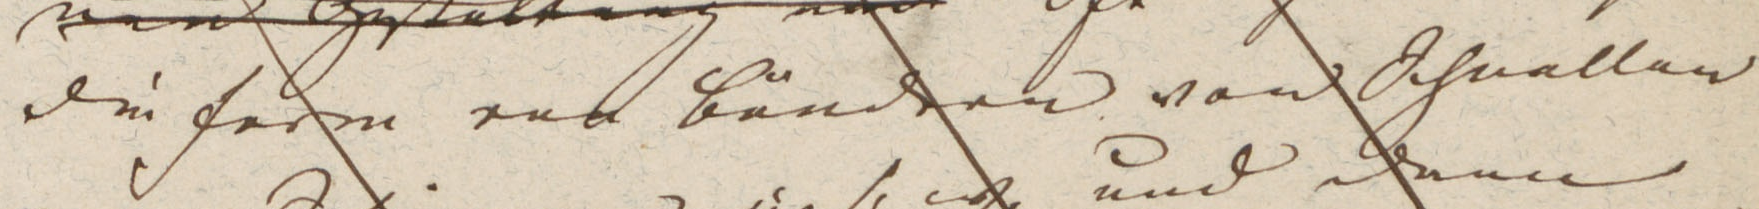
die Form von Bändern von Schnallen
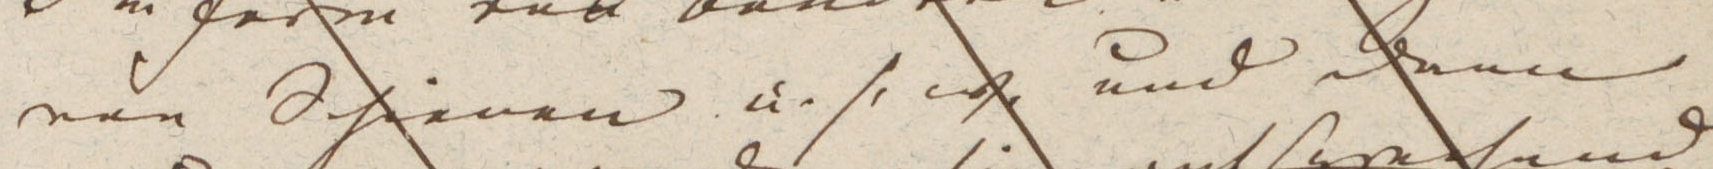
von Schienen u. s. w. und dann
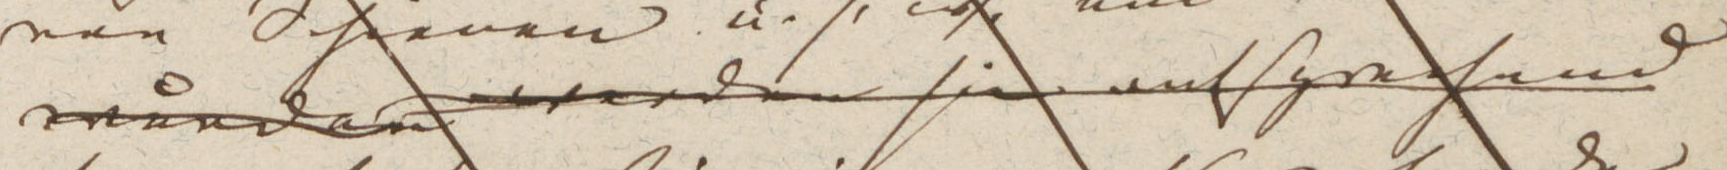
wurden werden sie entsprechend
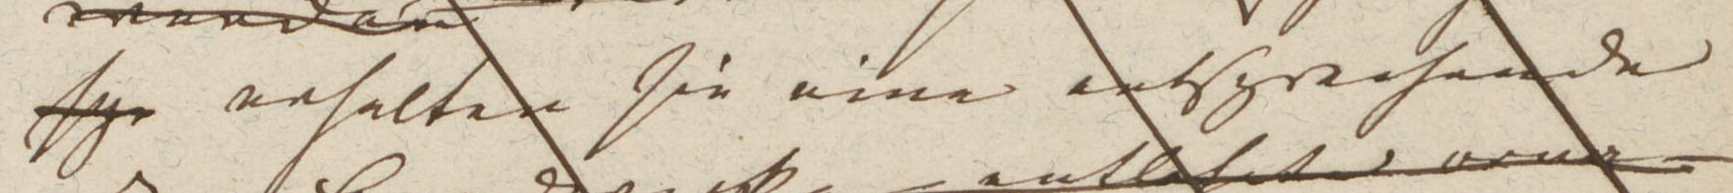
sy erhalten sie eine entsprechende
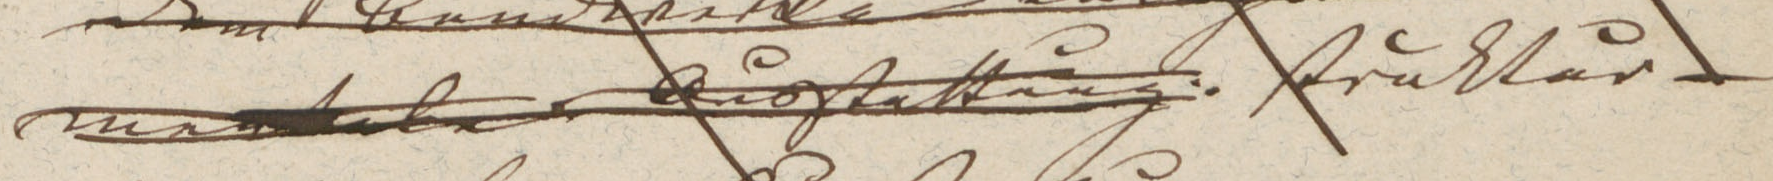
mentale Ausstattung. struktur-
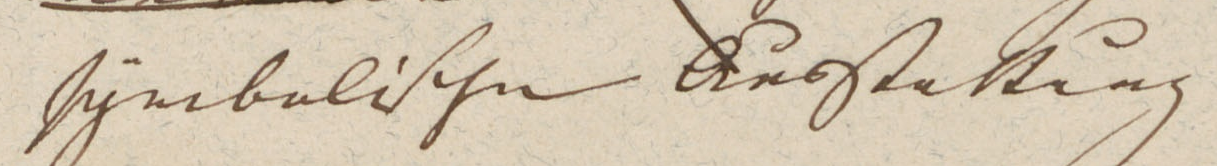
symbolische Ausstattung
